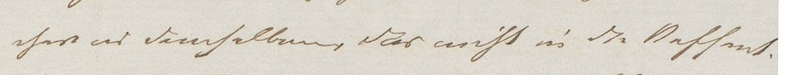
ches in demselben, das nicht in die Oeffent-
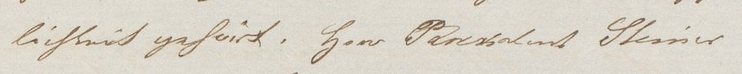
lichkeit gehört. Herr Praesident Steiner
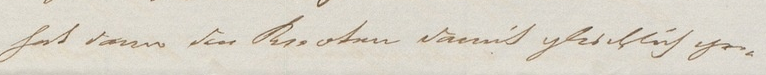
hat dann den Knoten damit glücklich ge-
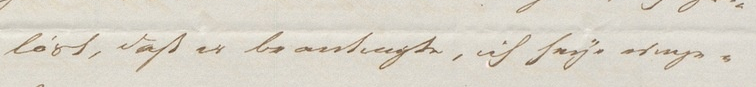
löst, daß er beantragte, ich seye einge-
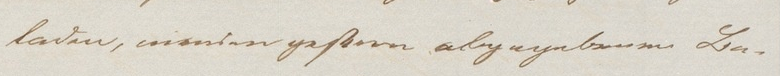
laden, meinen gestern abgegebenen Be-
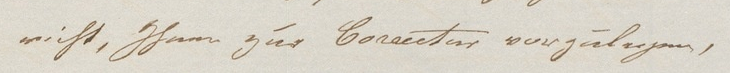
richt, Ihnen zur Correctur vorzulegen,
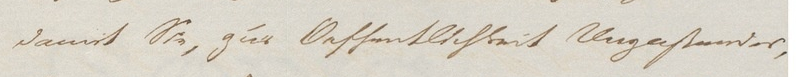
damit Sie, zur Oeffentlichkeit Unpaßendes,
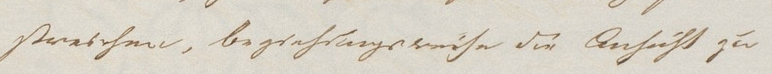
streichen, beziehungsweise die Ansicht zu
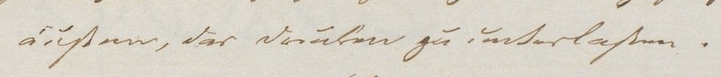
äußern, das Drucken zu unterlaßen.
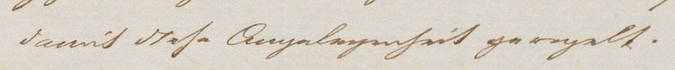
damit diese Angelegenheit geregelt.
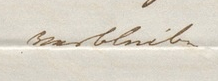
verbleibe
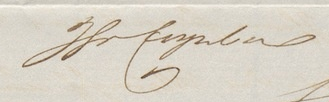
Ihr Ergebener
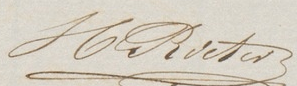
H Rieter
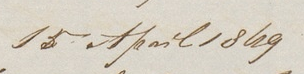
15 April 1869
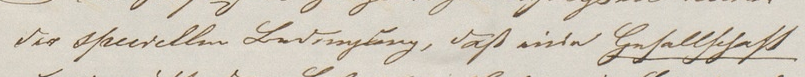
der speciellen Bedingung, daß eine Gesellschaft
